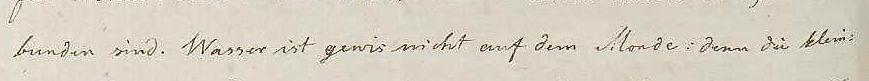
bunden sind. Wasser ist gewis nicht auf dem Monde: denn die klein-
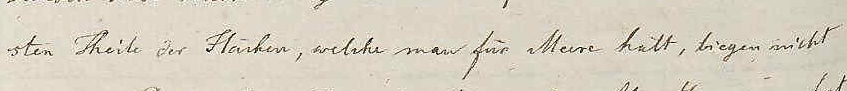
sten Theile der Flächen, welche man für Meere hält, liegen nicht
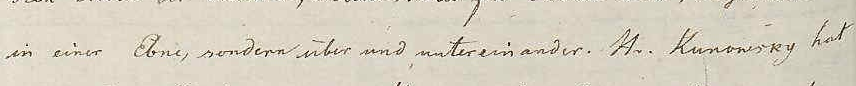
in einer Ebne, sondern über und untereinander. Hr. Kunowsky hat
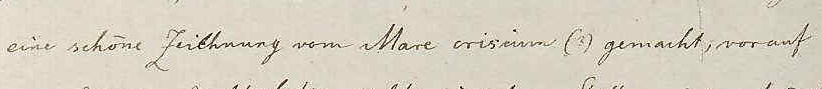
eine schöne Zeichnung vom Mare crisium gemacht, vorauf
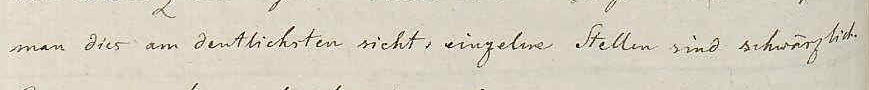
man dies am deutlichsten sieht: einzelne Stellen sind schwärzlich.
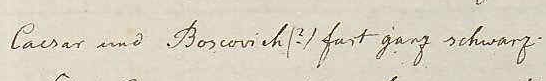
Caesar und Boscovich fast ganz schwarz.
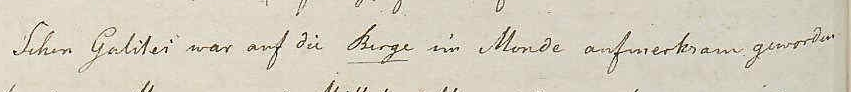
Schon Galilei war auf die Berge im Monde aufmerksam geworden
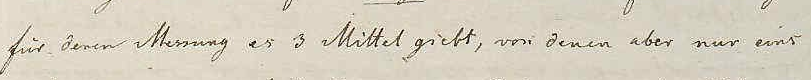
für deren Messung es 3 Mittel giebt, von denen aber nur eins
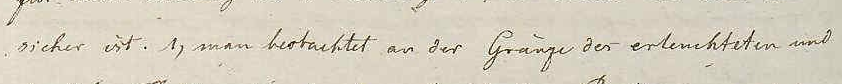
sicher ist. 1, man beobachtet an der Gränze des erleuchteten und
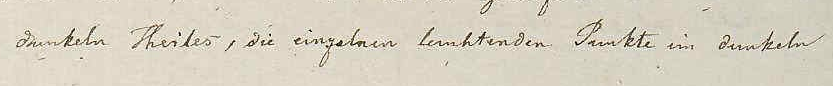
dunkeln Theiles, die einzelnen leuchtenden Punkte im dunkeln
